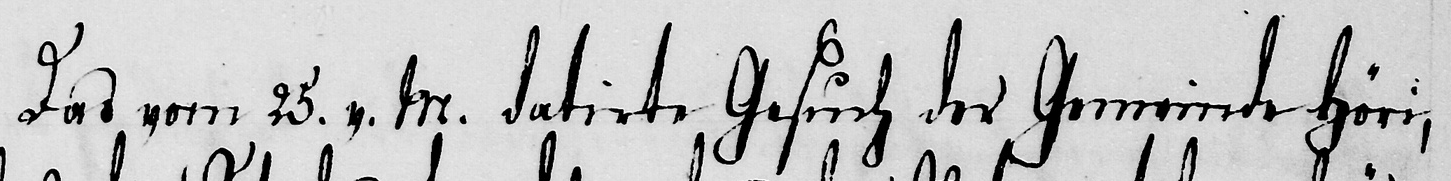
Das vom 25. v. M. datirte Gesuch der Gemeinde Höri,
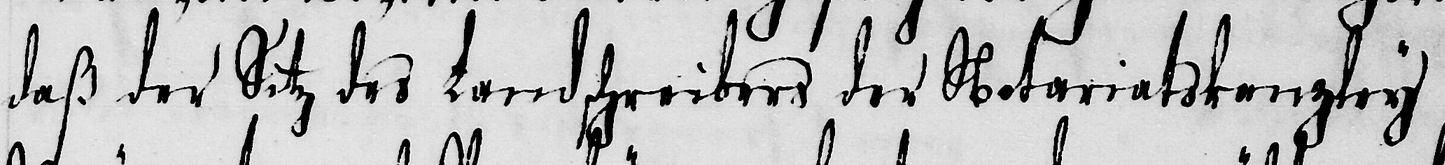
daß der Sitz des Landschreibers der Notariatskanzley
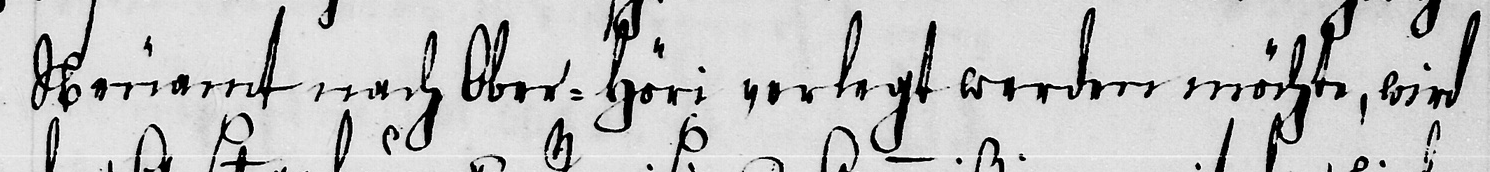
Neuamt nach Ober-Höri verlegt werden möchte, wird
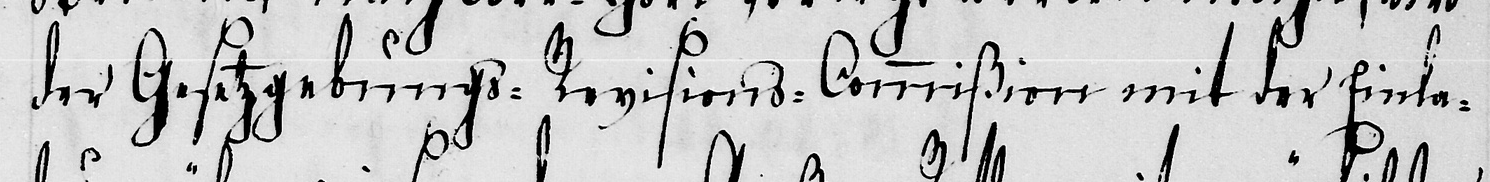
der Gesetzgebungs-Revisions-Commißion mit der Einla¬
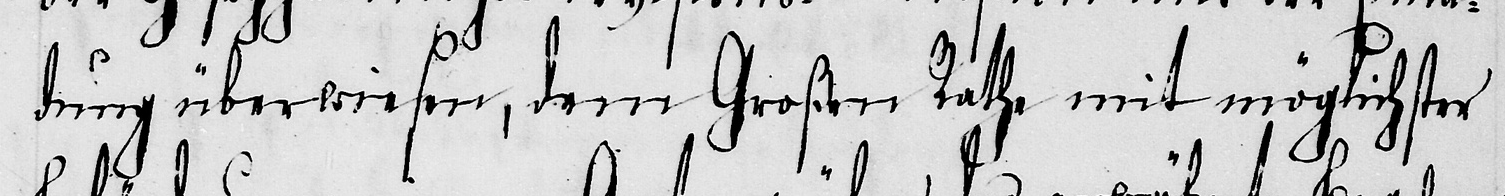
dung überwiesen, dem Großen Rath mit möglichster
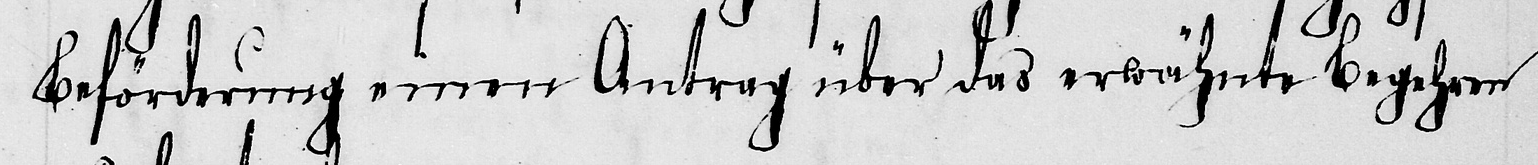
Beförderung einen Antrag über das erwähnte Begehren
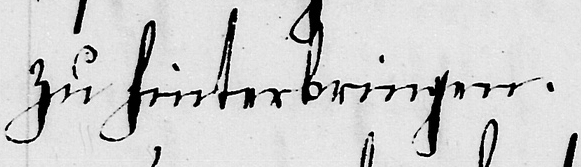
zu hinterbringen.
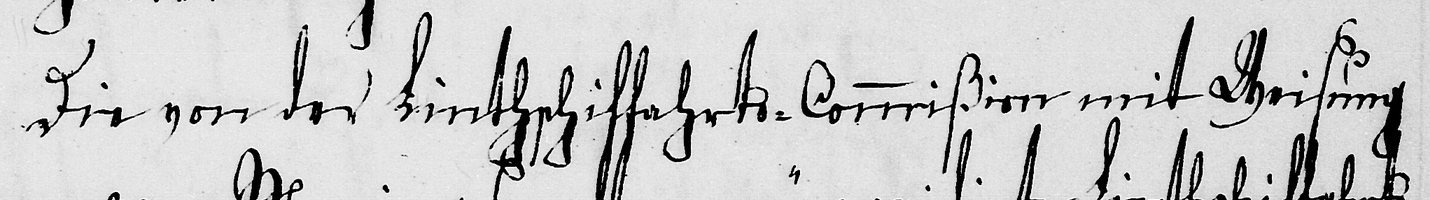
Die von der Linthschiffahrts-Commißion mit Weisung
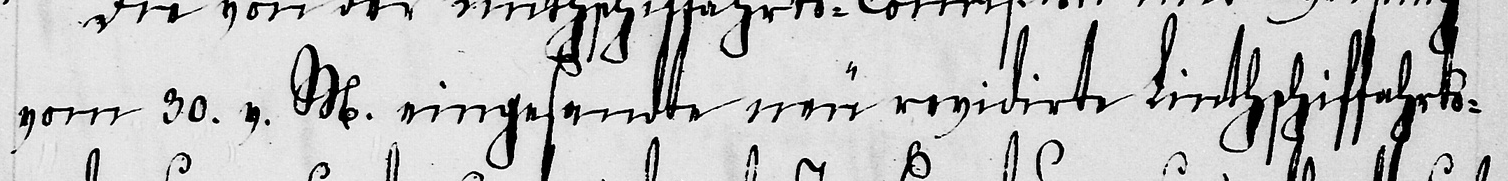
vom 30. v. M. eingesandte neu revidierte Linthschiffahrts¬
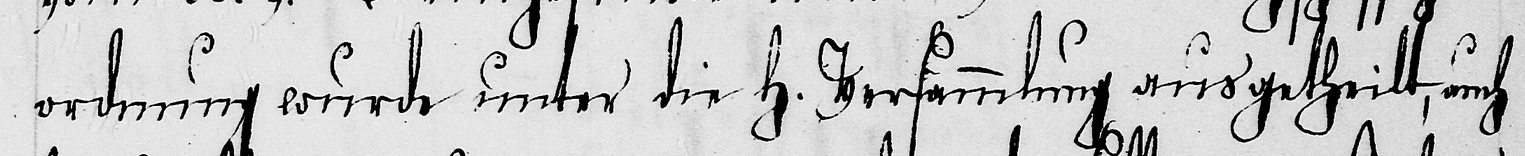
ordnung wurde unter die H. Versammlung ausgetheilt, au¬
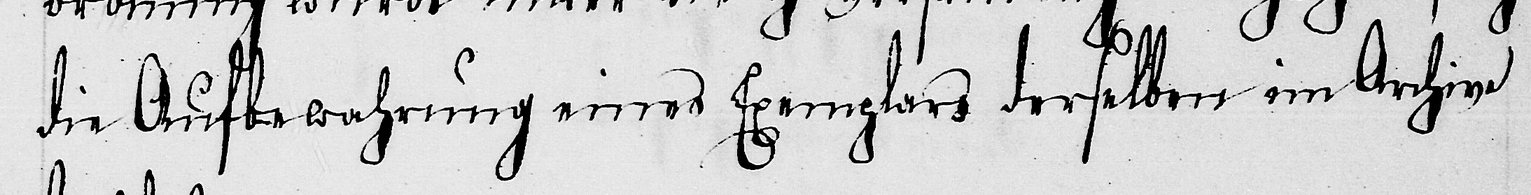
die Aufbewahrung eines Exemplars derselben im Archive
